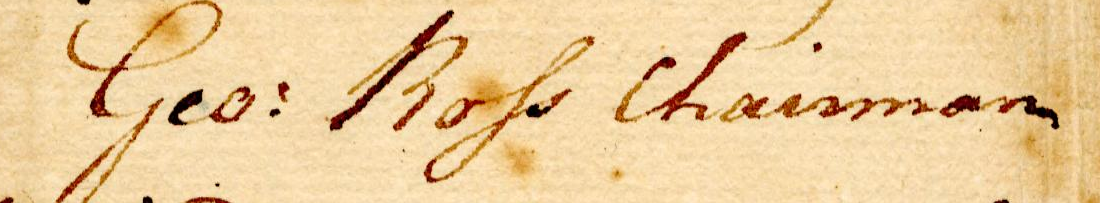Geo: Ross Chairman
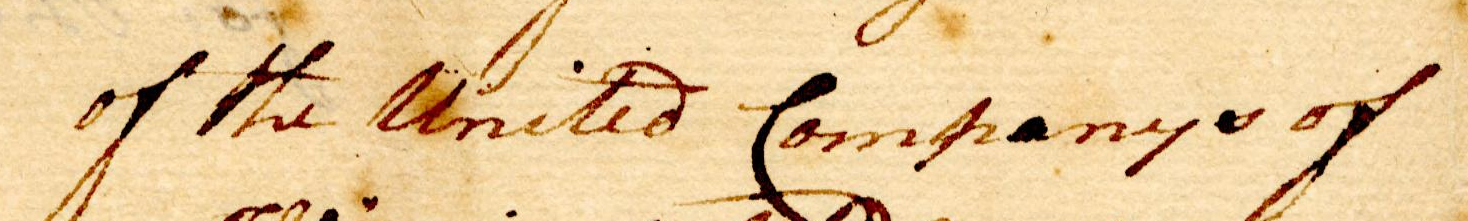of the United Companys of
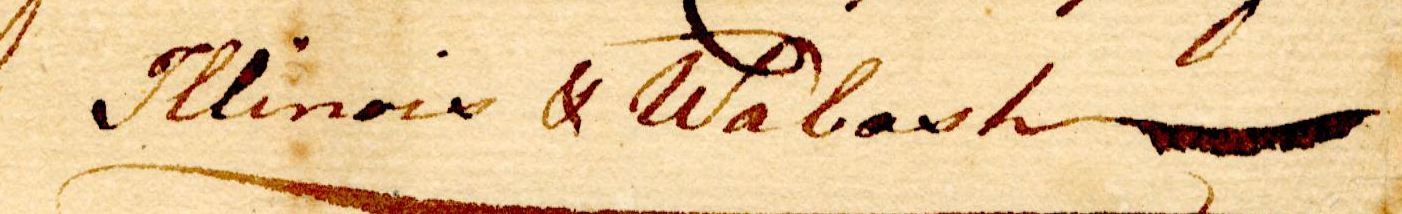Illinos & Wabash
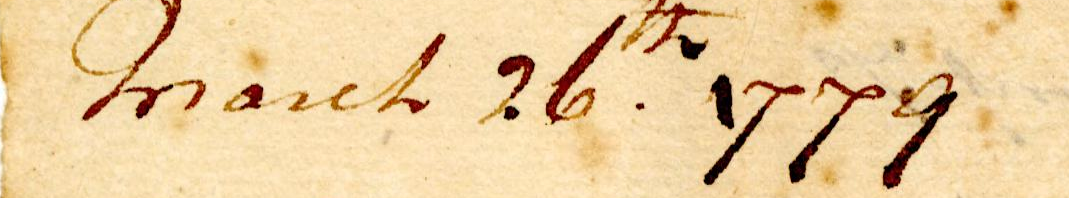March 26^th. 1779
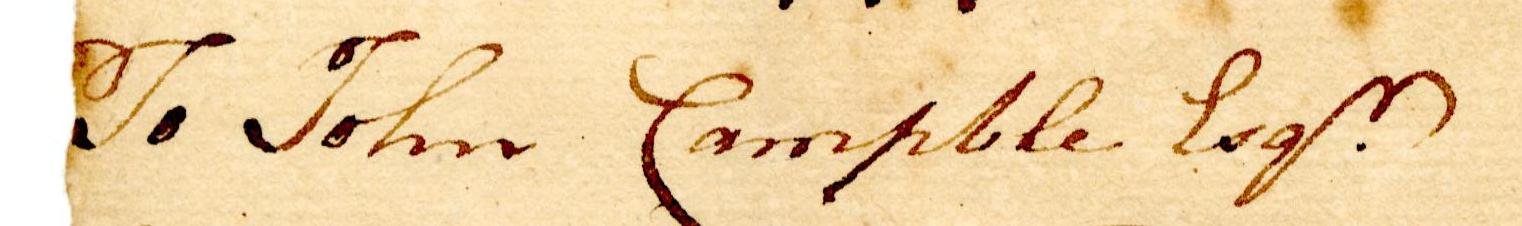To John Campble Esq^r.
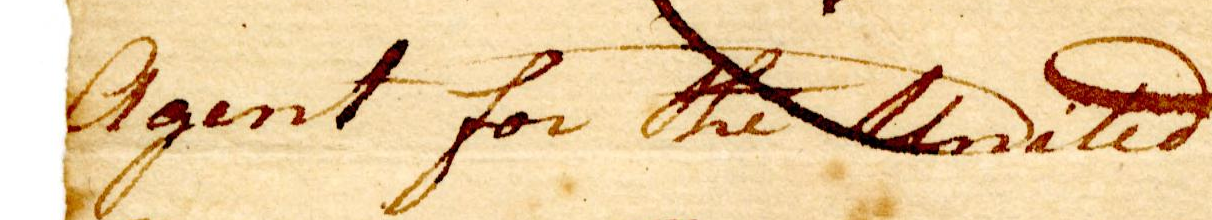Agent for the United
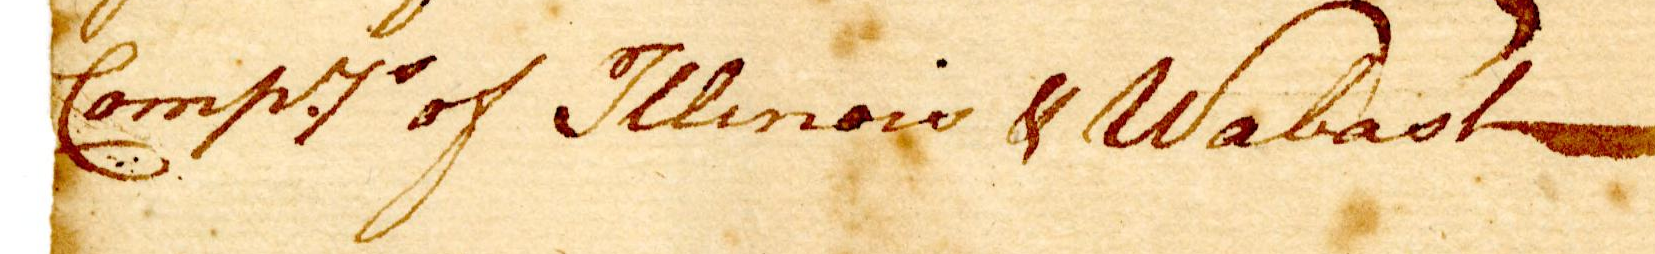Comp^ys. of Illinois & Wabash
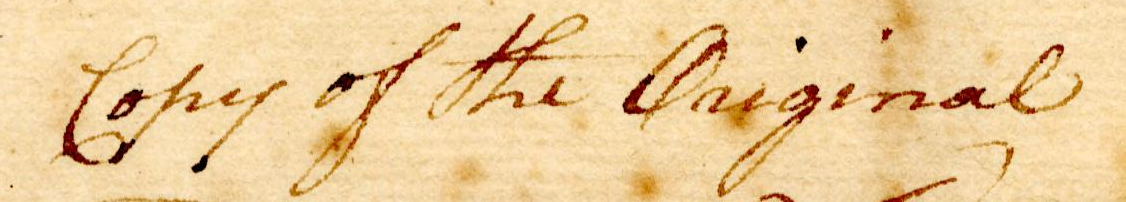Copy of the Original
